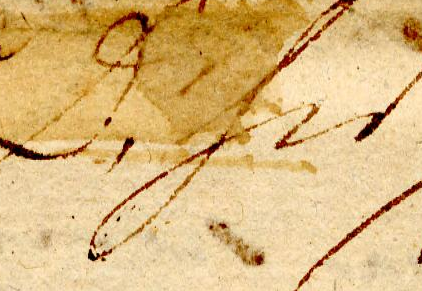D^r Sir
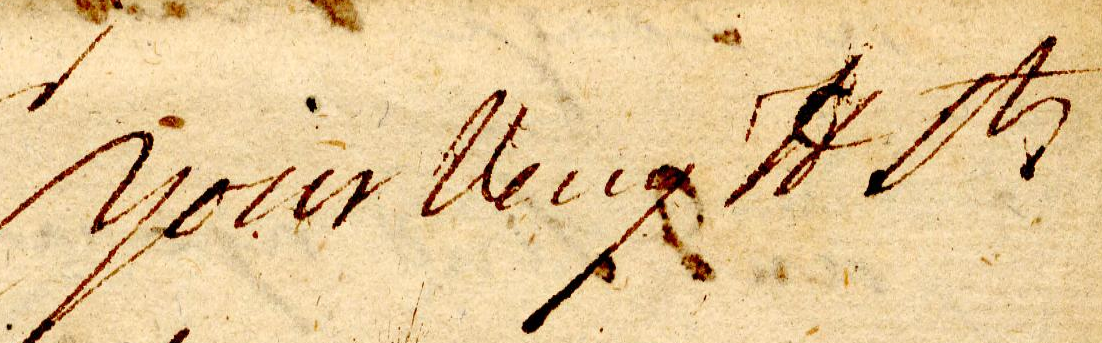Your Very H s^t
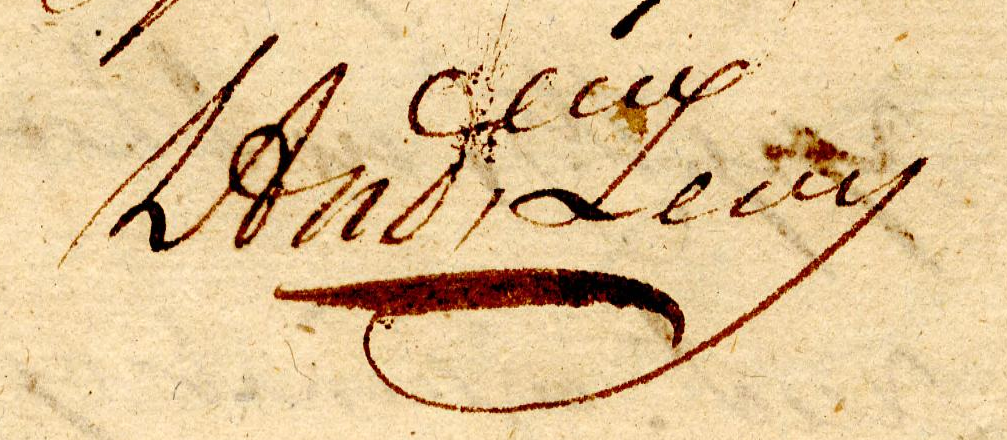And^rew Levy
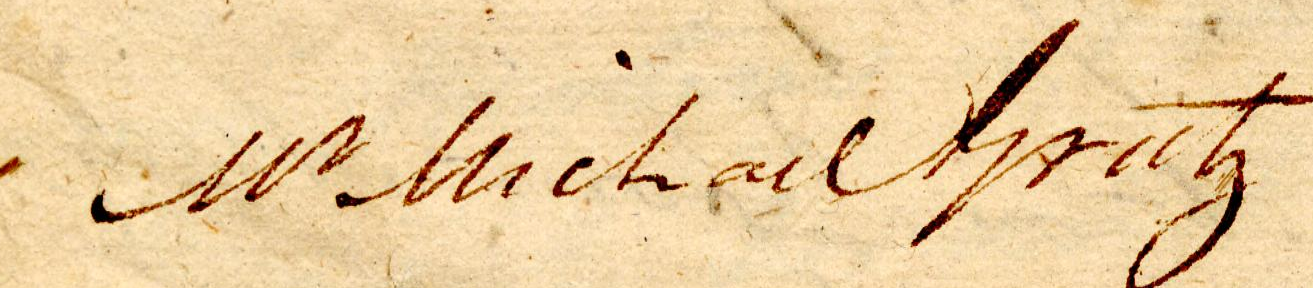M^r Michael Gratz
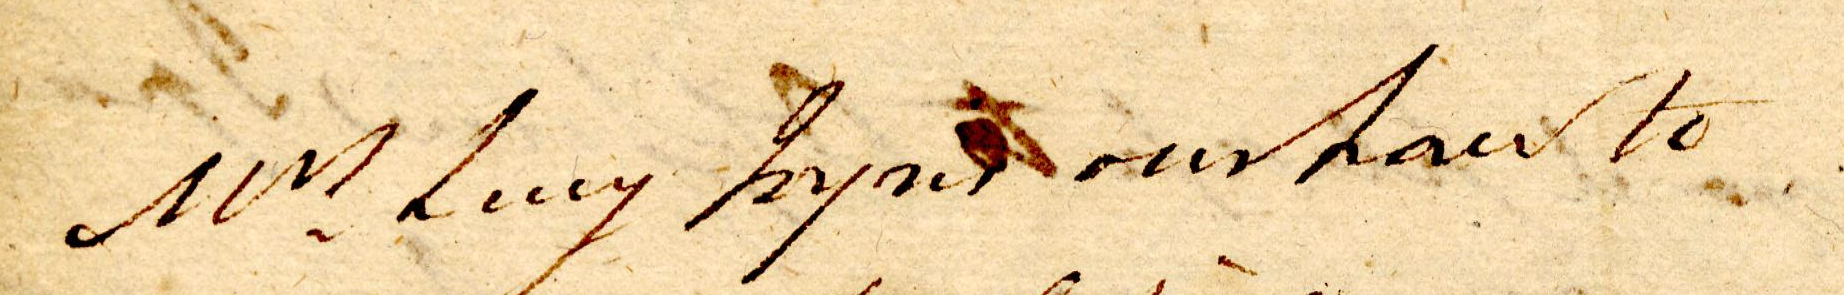M^rs. Levy Joyns our love to
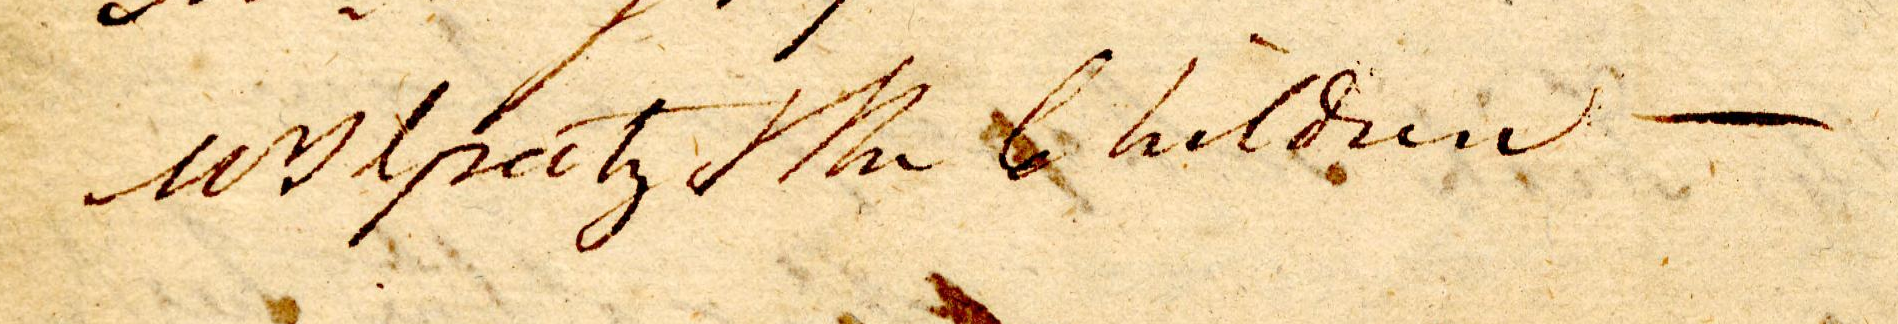M^rs Gratz & the Children
